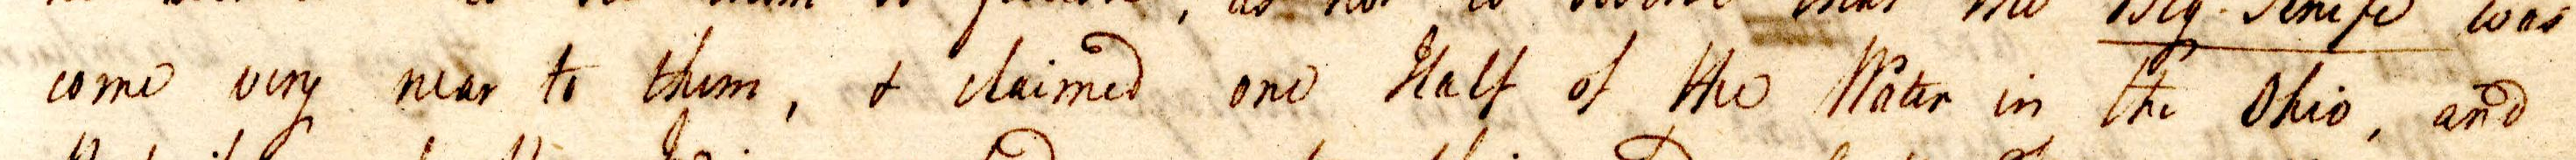come very near to them, & claimed one Half of the Water in the Ohio, and
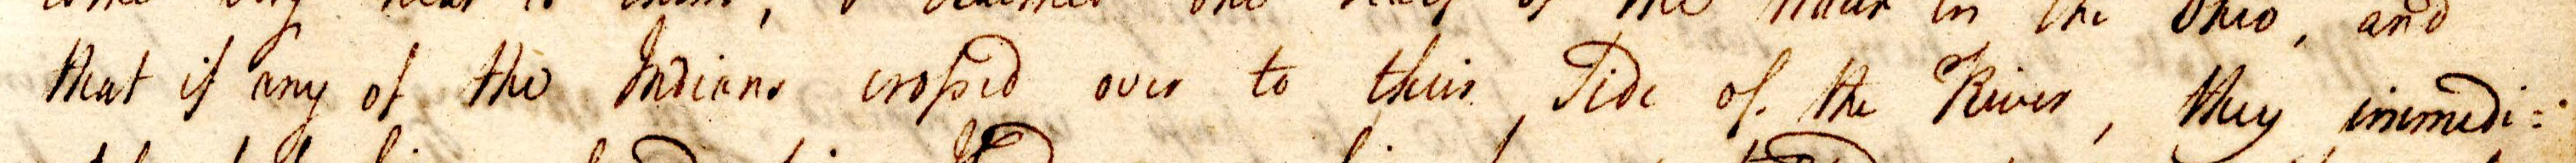that if any of the Indians crossed over to their Side of the River, they immedi-
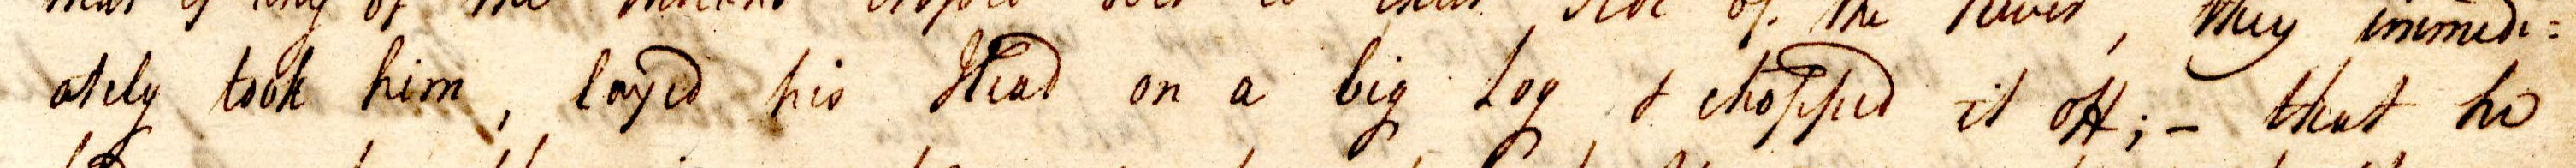-ately took him, layed his Head on a big Log & chopped it off;- that he
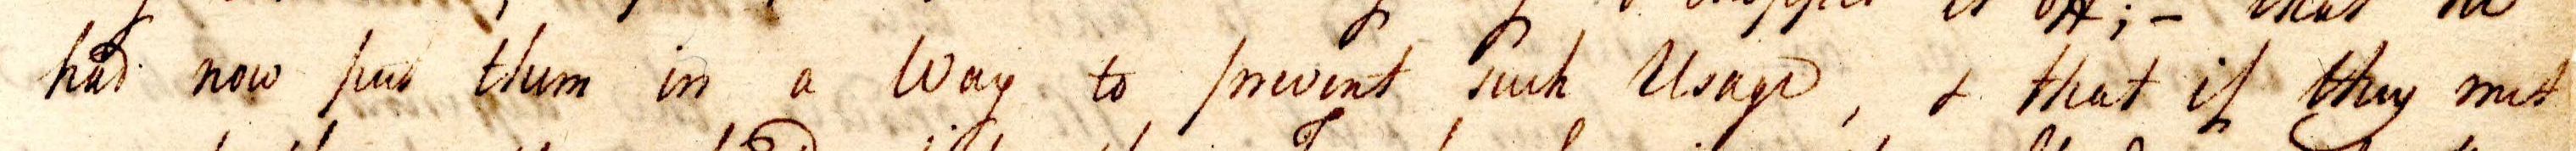has now put them in a Way to prevent such Usage, & that if they met
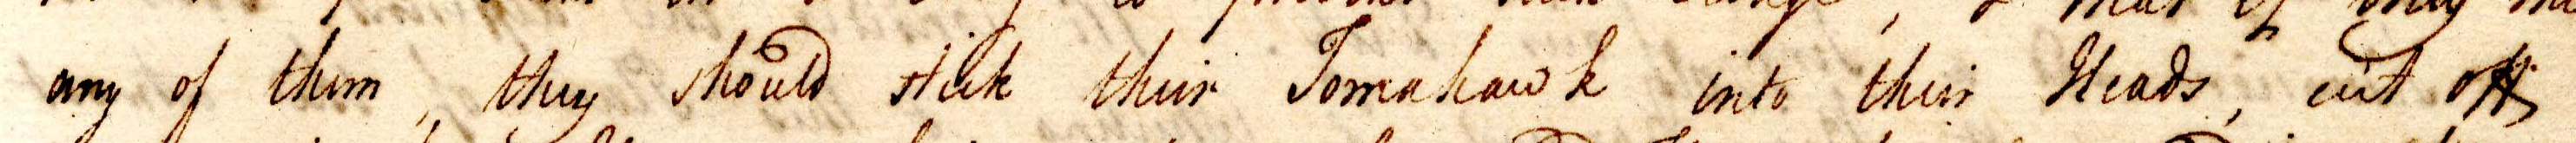any of them they should stick their Tomahawk into their Heads, cut off
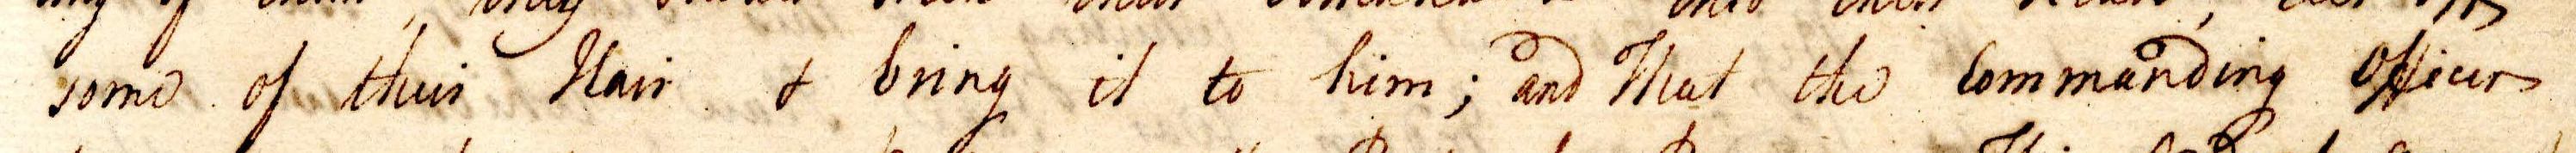some of their Hair & bring it to him; and that the Commanding Officers
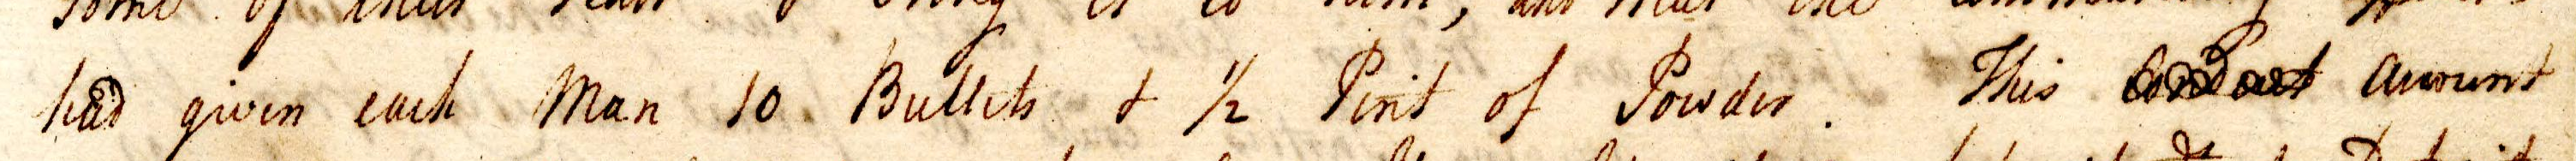had given each Man 10 Bullets & 1/2 Pint of Powder. This [______] Amount
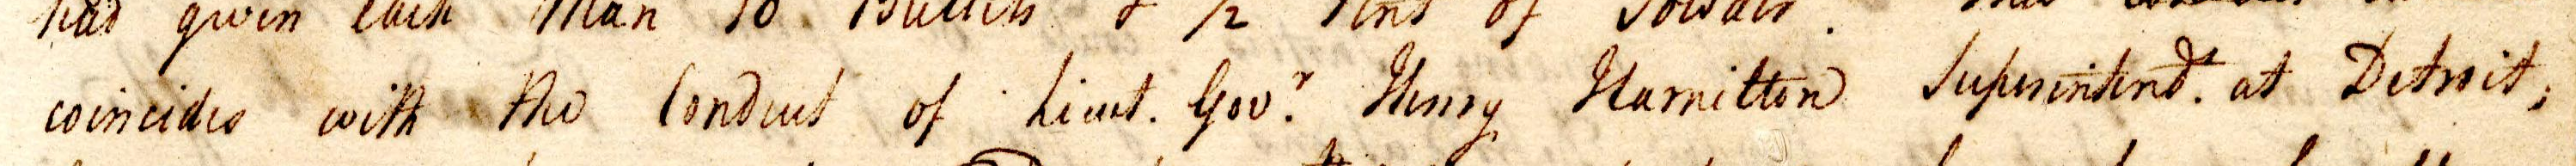coincides with the Conduct of Lieut. Gov^r. Henry Hamilton Superintend^t. at Detroit;
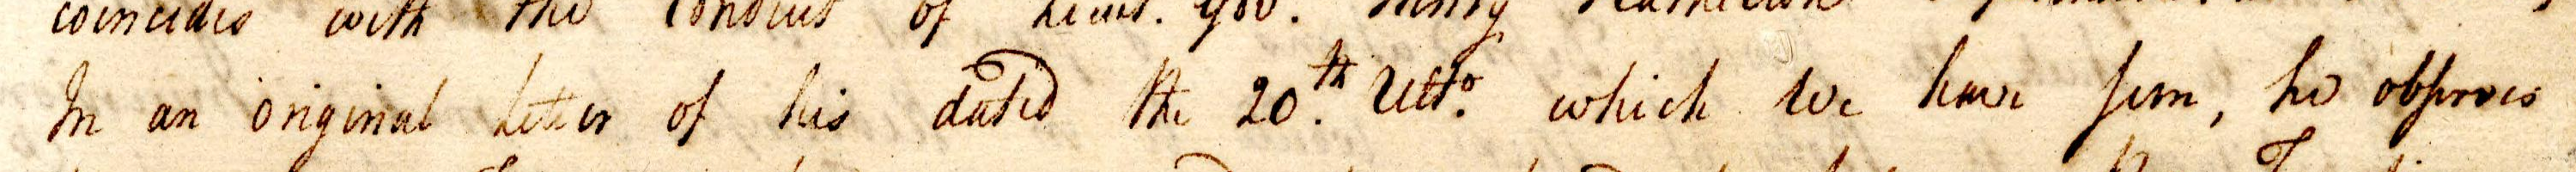In an original Letter of his dated the 20^th. Ult^o. which we have seen, he observes
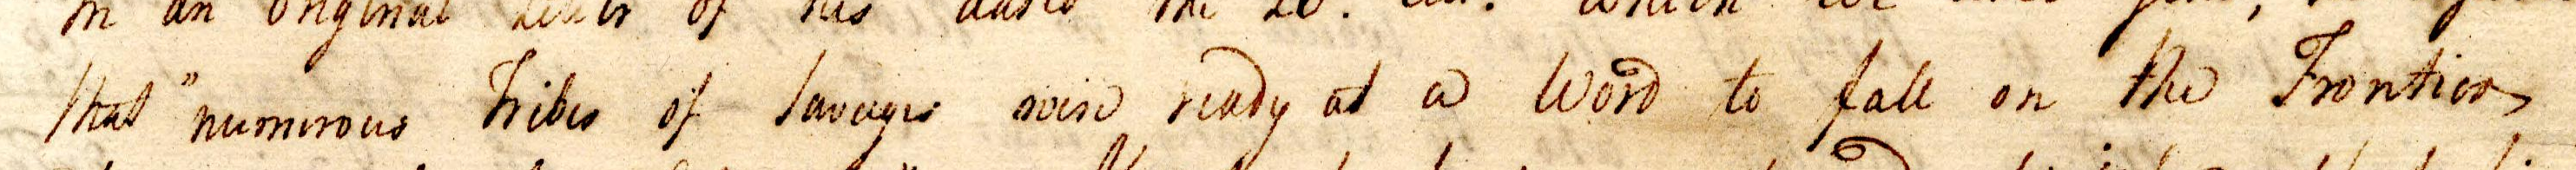that "numerous Tribes of Savages seem ready at a Word to fall on the Frontier
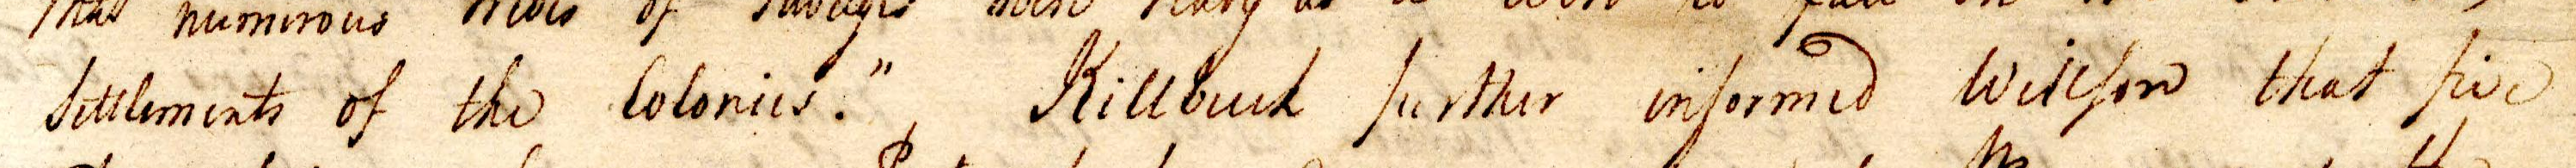Settlements of the Colonies." Killbuck further informed Willson that five
